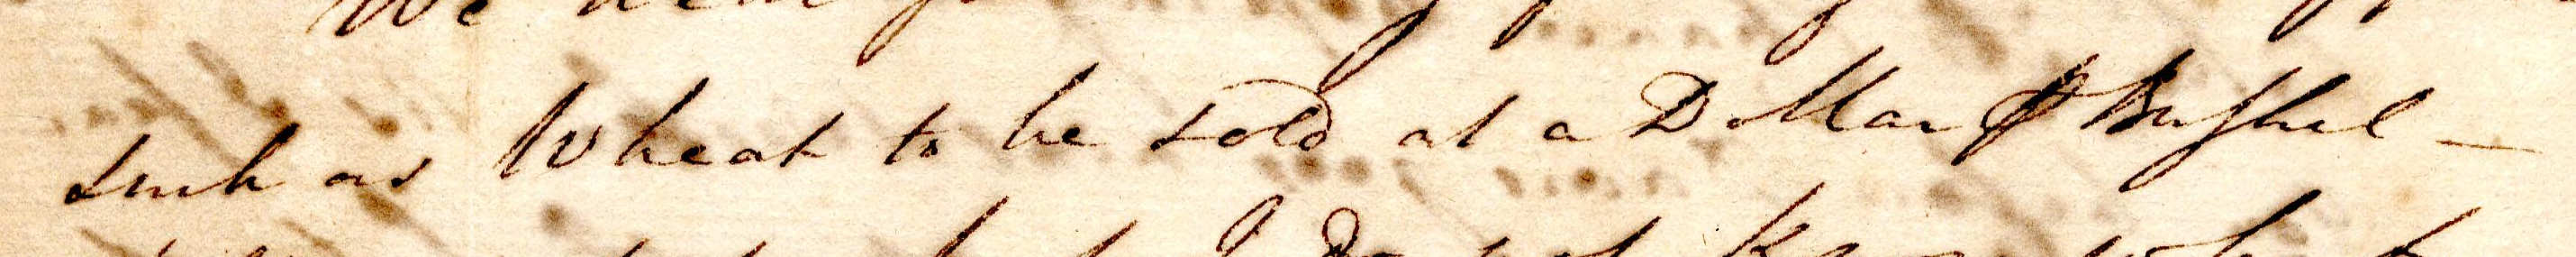such as Wheat to be sold at a Dollar per bushel-
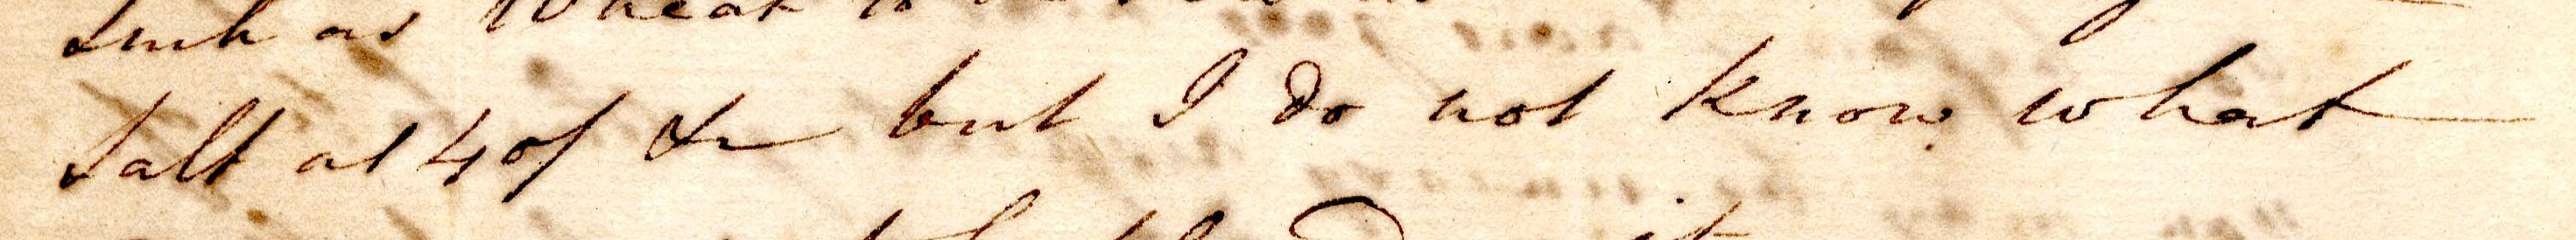Salt at 4s &c but I do not know what
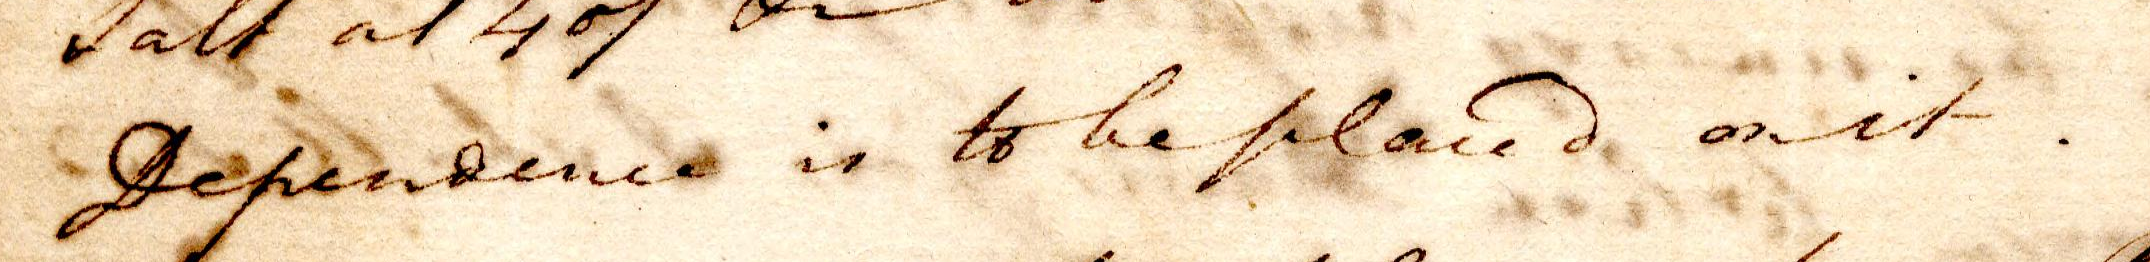Dependence is to be placed on it.
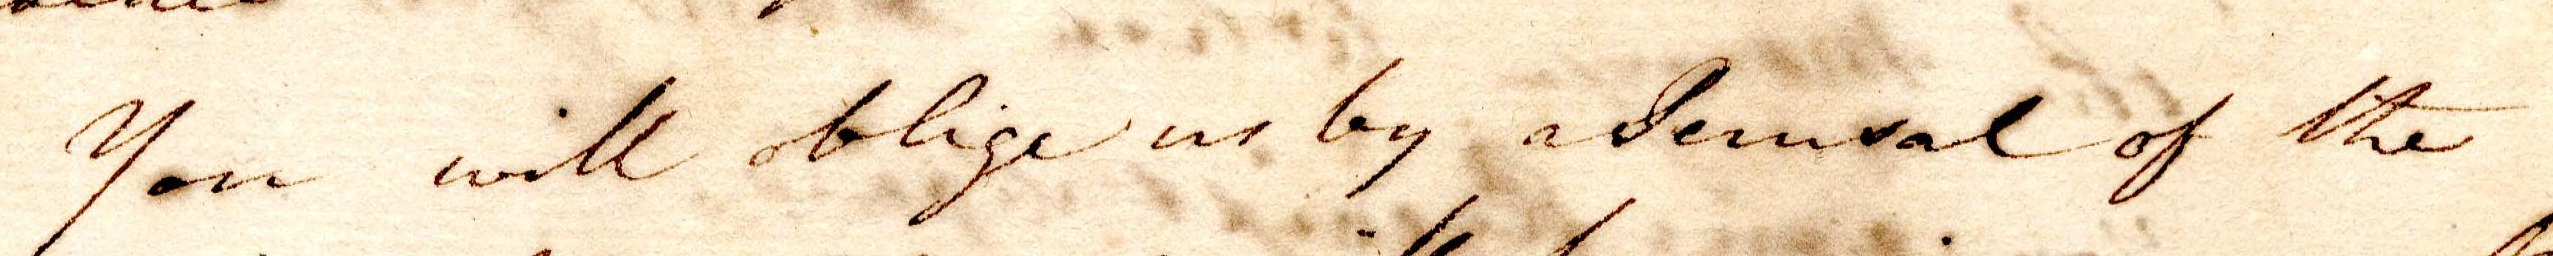You will oblige us by a Perusal of the
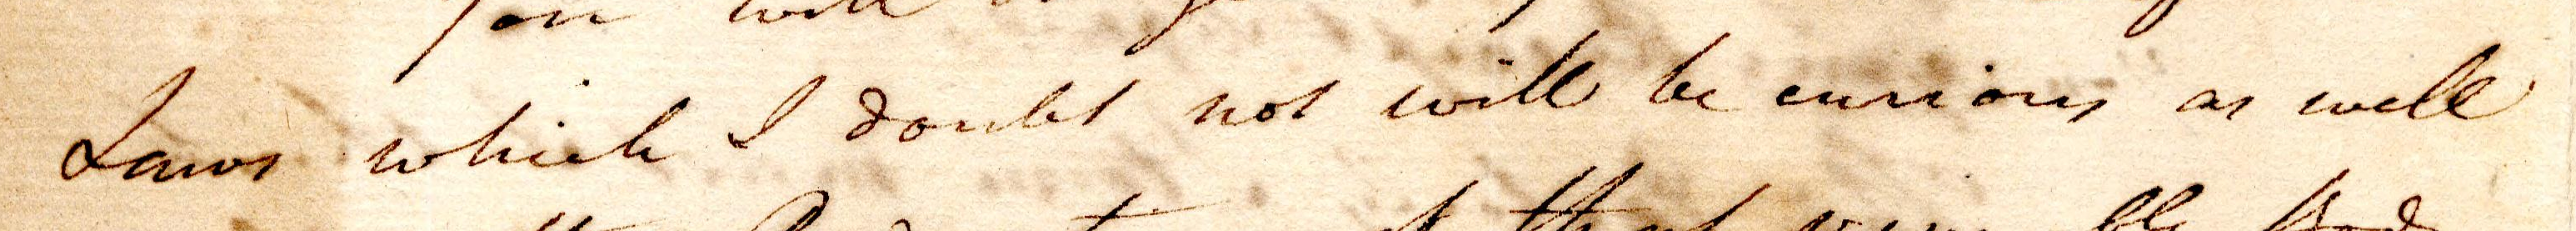Laws which I doubt not will be curious as well
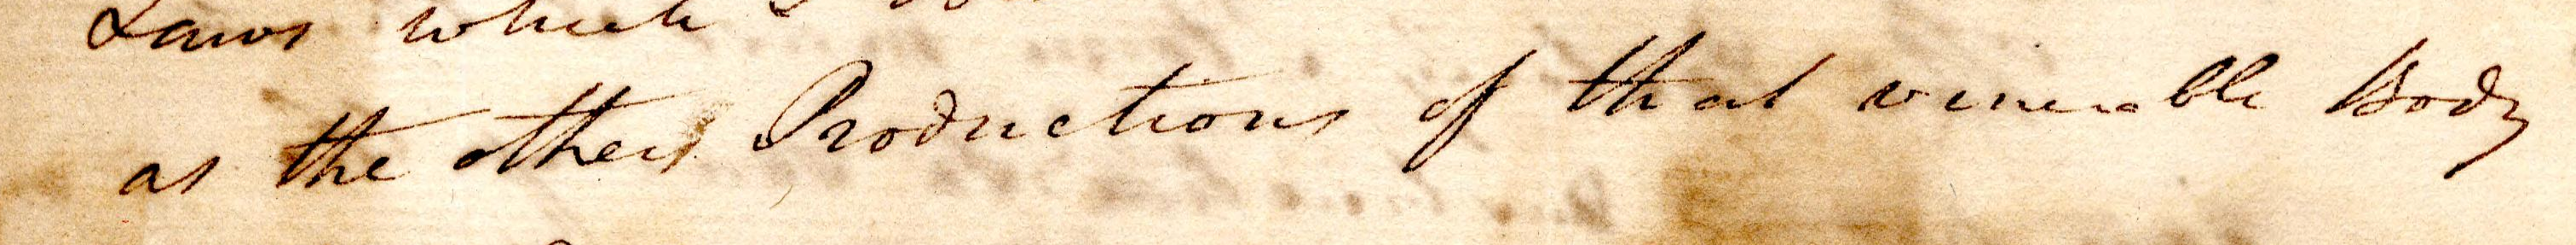as the other Productions of that venerable Body
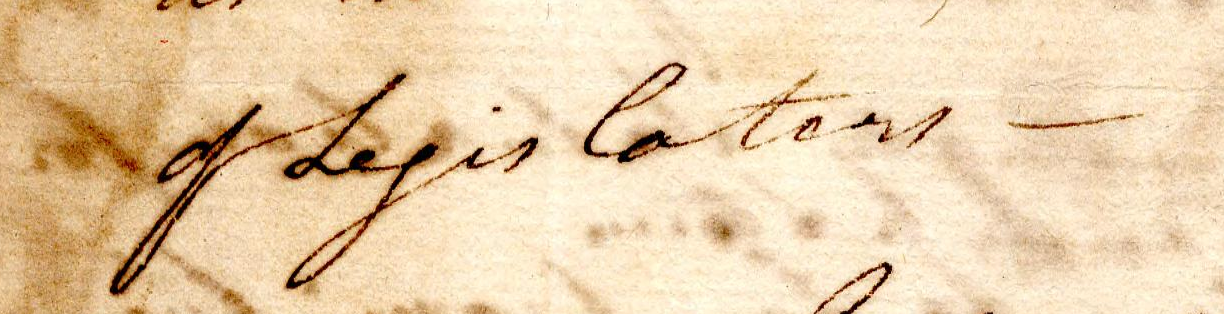of Legislators-
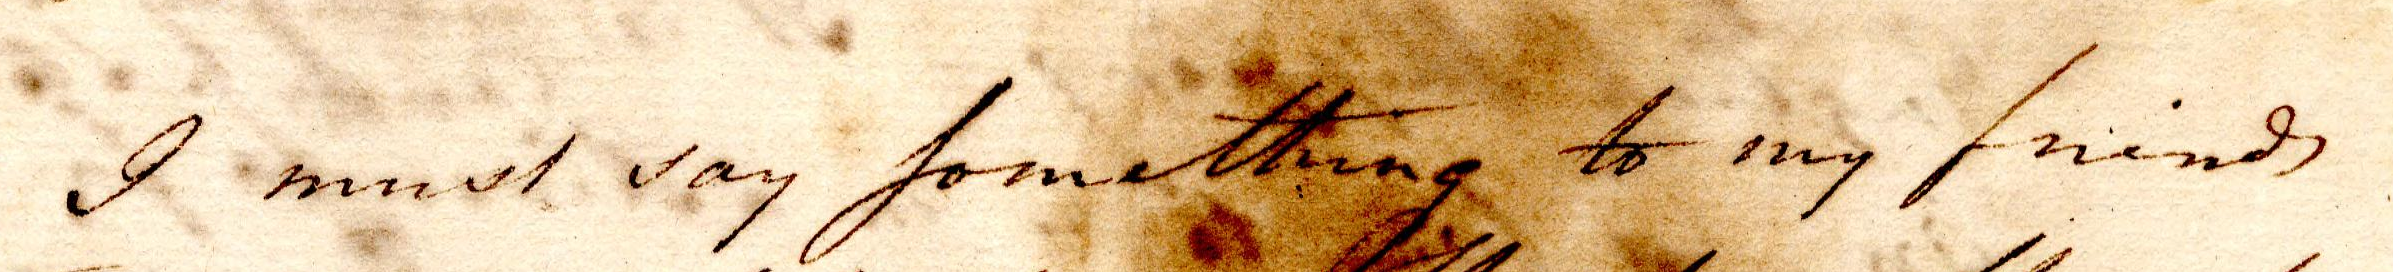I must say something to my friends
